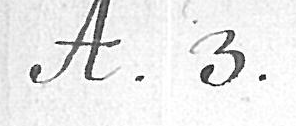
A. 3.
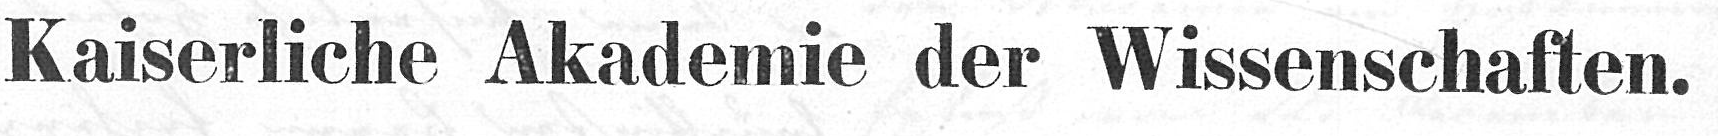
Kaiserliche Akademie der Wissenschaften.
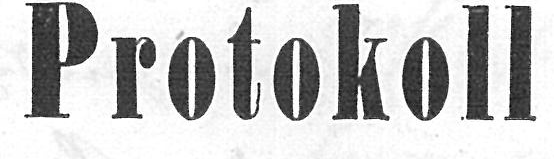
Protokoll
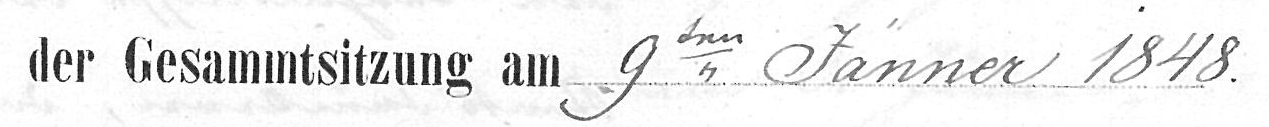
der Gesammtsitzung am 9ten Jänner 1848
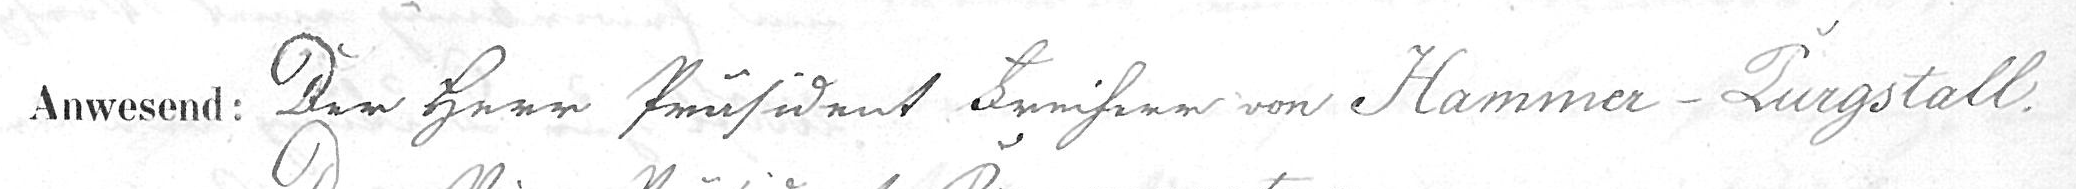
Anwesend: Der Herr Präsident Freiherr von Hammer-Purgstall
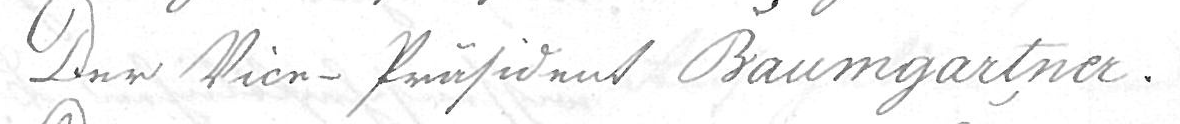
Der Vice-Präsident Baumgartner
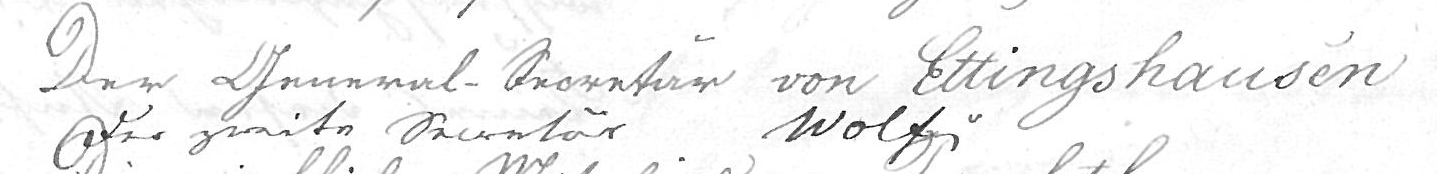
Der General-Secretär von Ettingshausen
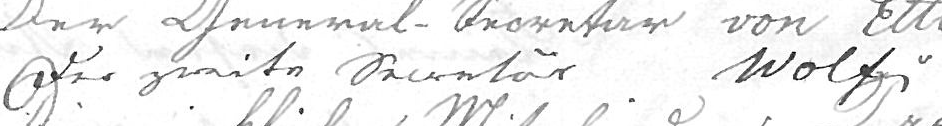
der zweite Secretär Wolf
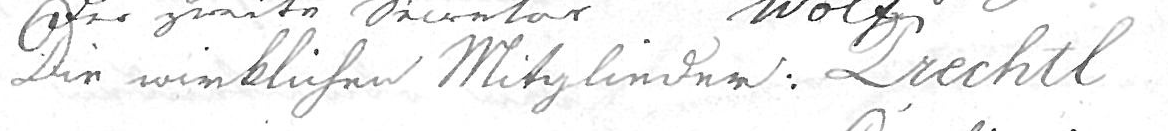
Die wirklichen Mitglieder: Prechtl
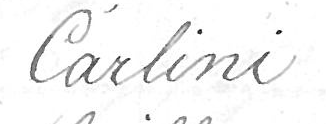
Carlini
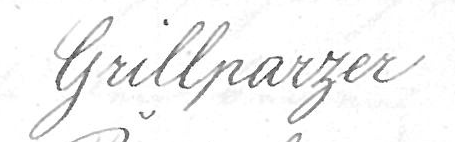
Grillparzer
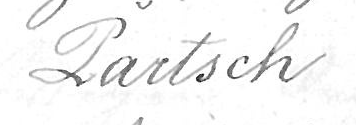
Partsch
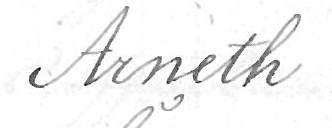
Arneth
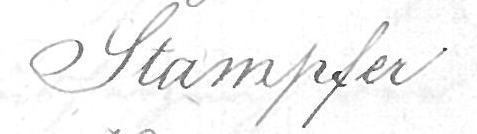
Stampfer
